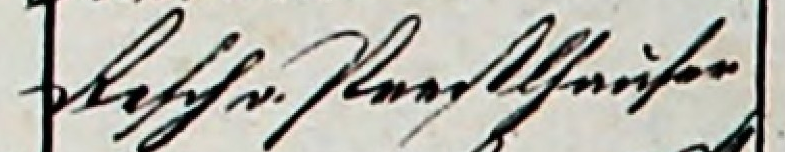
Resch v. Preßlhauser
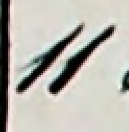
11
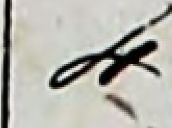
4
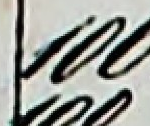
106
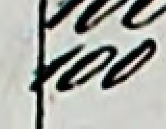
100
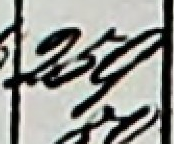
259
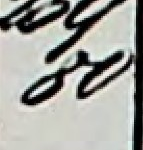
80
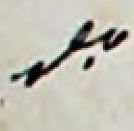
do
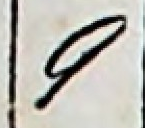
9
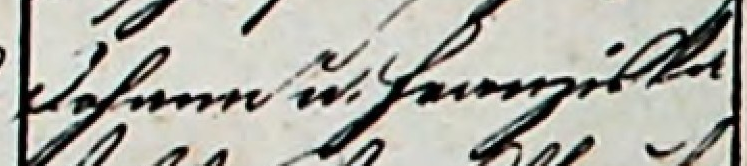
Johann u. Franziska
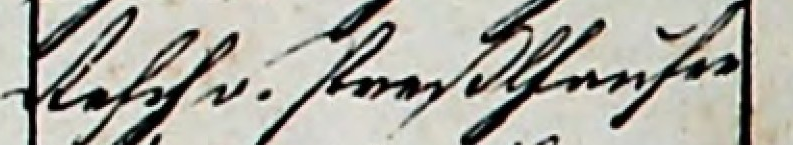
Resch v. Preßlhauser
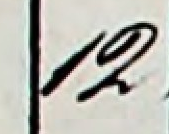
12
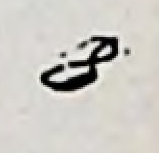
8
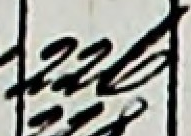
226
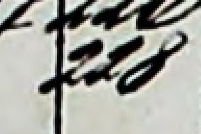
228
